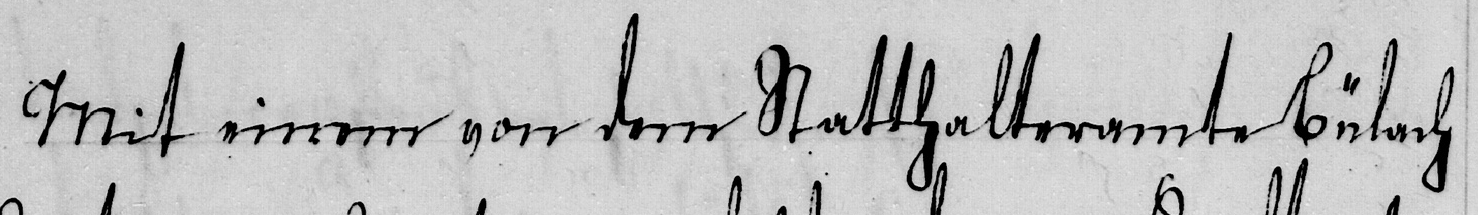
Mit einem von dem Statthalteramte Bülach
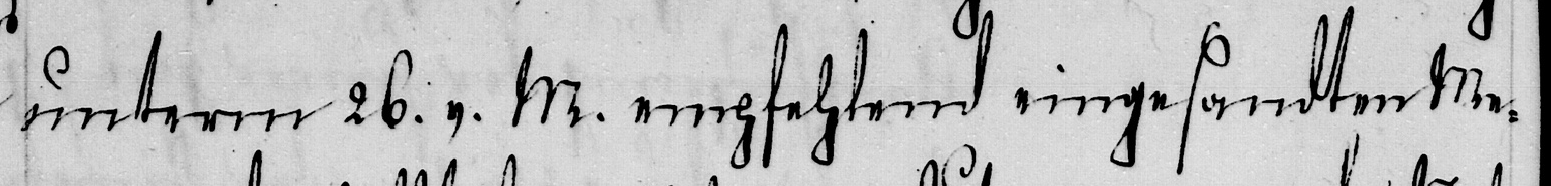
unterm 26. v. M. empfehlend eingesandten Me¬
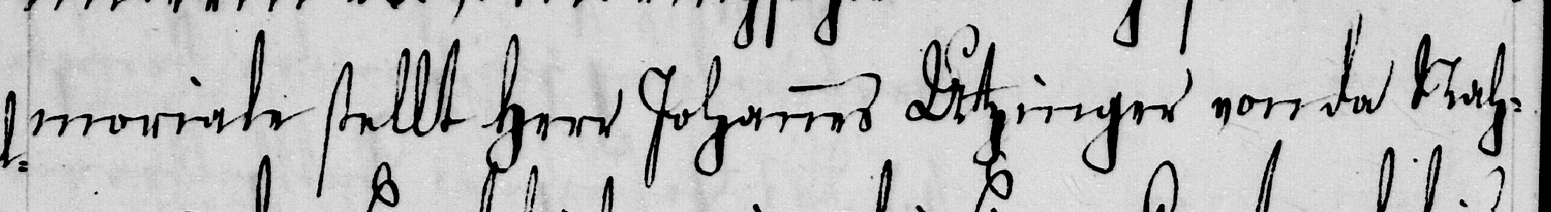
moriale stellt Herr Johannes Utzinger von da Nah¬
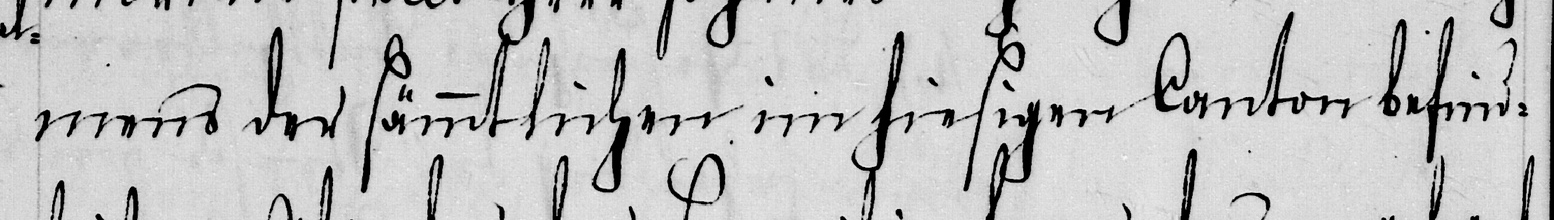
mens der sämmtlichen im hiesigen Canton befind¬
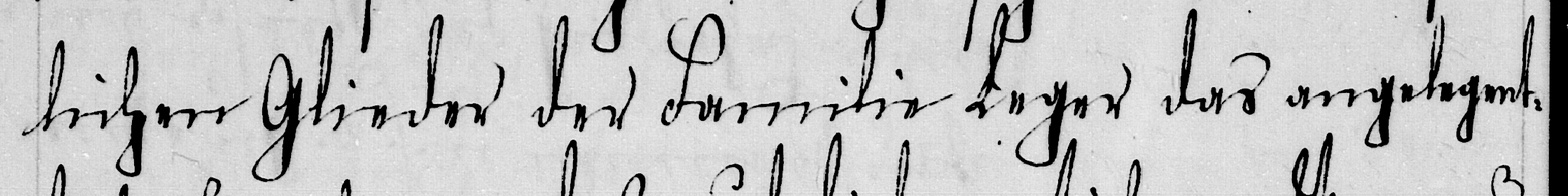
lichen Glieder der Familie Leger das angelegent¬
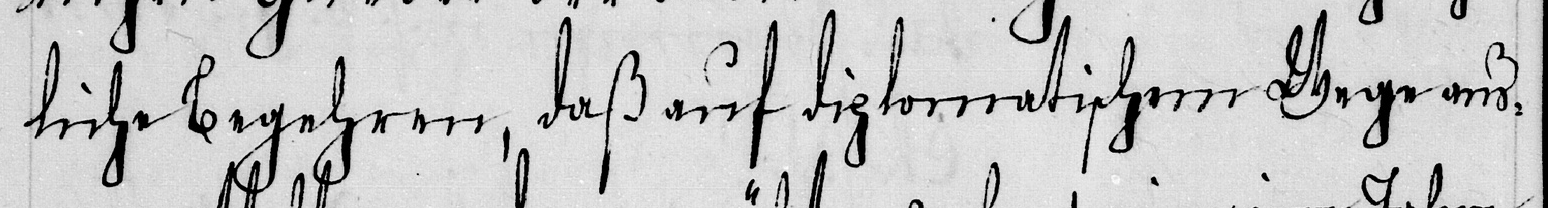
liche Begehren, daß auf diplomatischem Wege aus¬
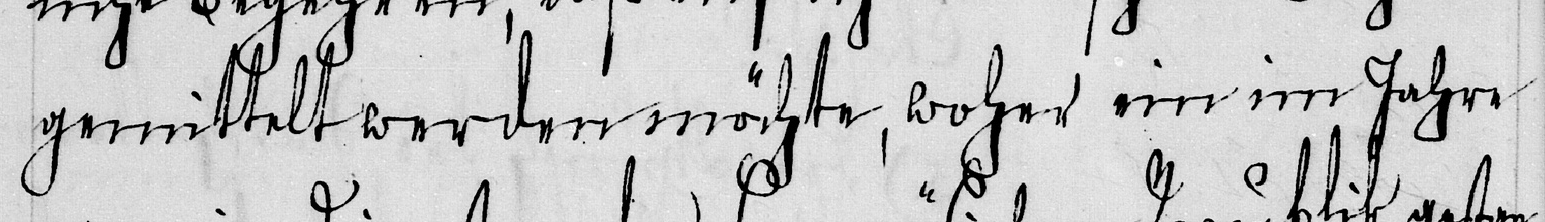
gemittelt werden möchte, woher ein im Jahre
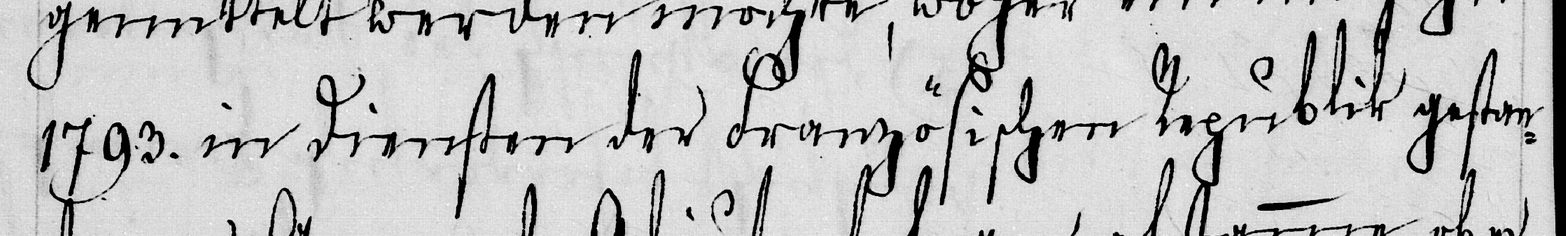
1793. in Diensten der Französischen Republik gestan¬
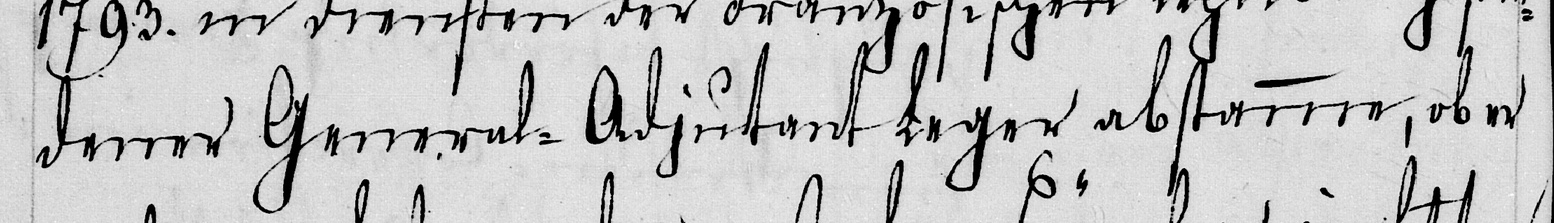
dener General-Adjutant Leger abstamme, ob er
